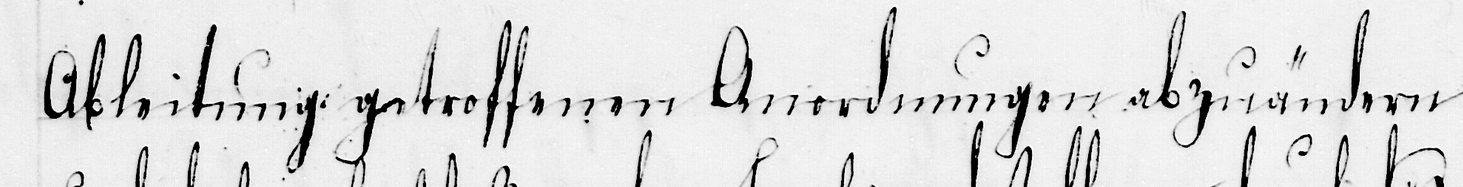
Ableitung getroffenen Anordnungen abzuändern
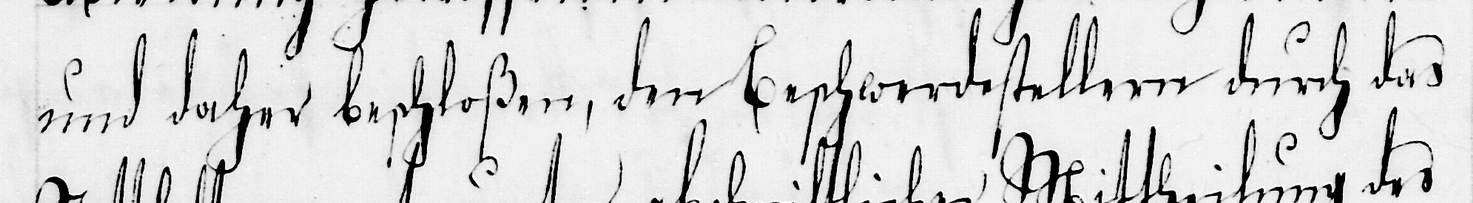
und daher beschloßen, den Beschwerdestellern durch das
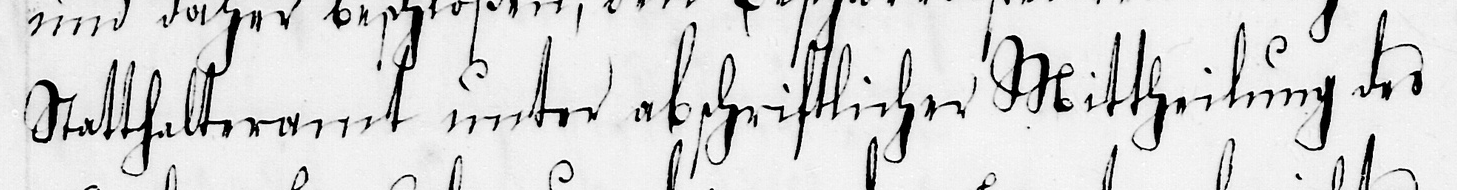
Statthalteramt unter abschriftlicher Mittheilung des
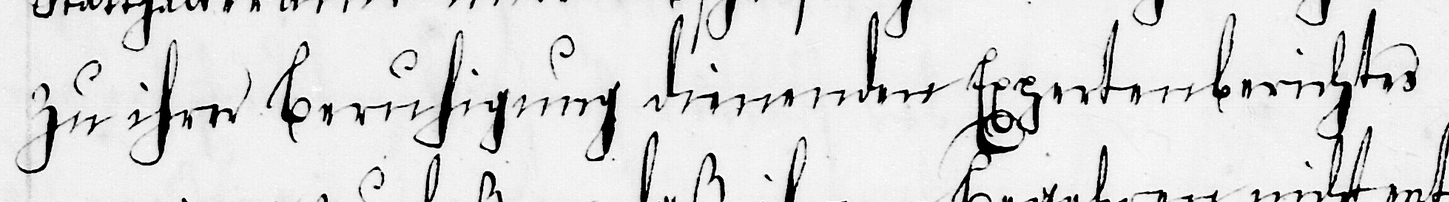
zu ihrer Beruhigung dienenden Expertenberichtes
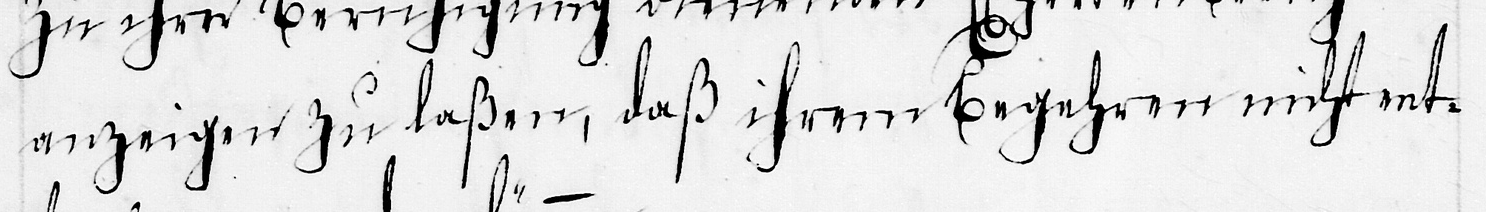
anzeigen zu laßen, daß ihrem Begehren nicht ent¬
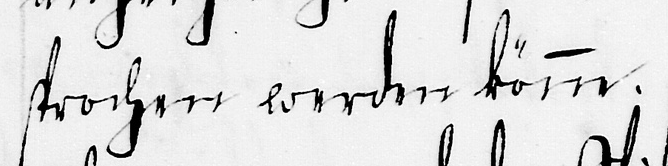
sprochen werden könne.
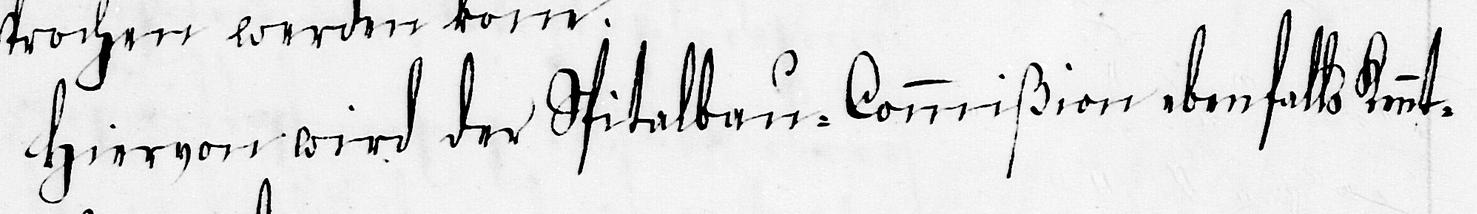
Hiervon wird der Spitalbau-Commißion ebenfalls Ken¬
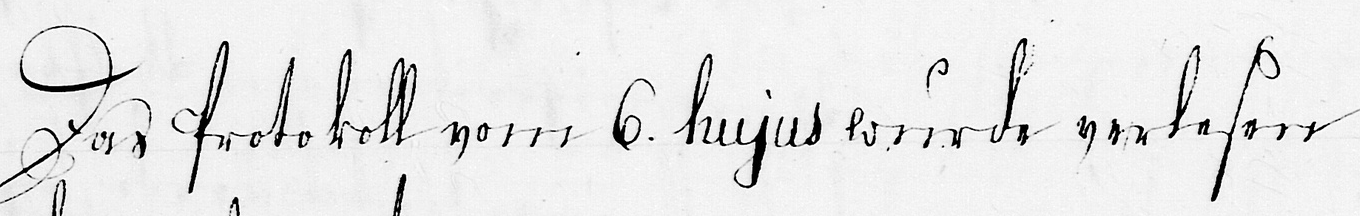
Das Protokoll vom 6. hujus wurde verlesen
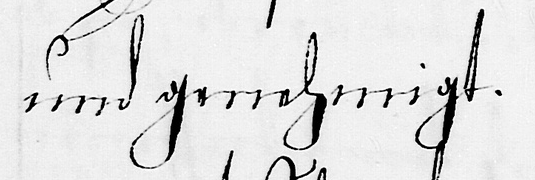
und genehmigt.
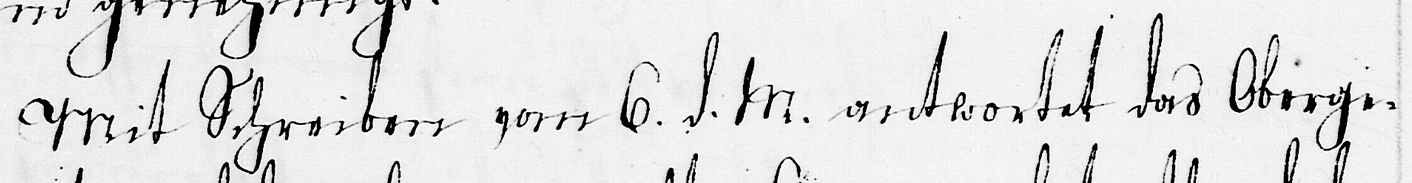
Mit Schreiben vom 6. d. M. antwortet das Oberge¬
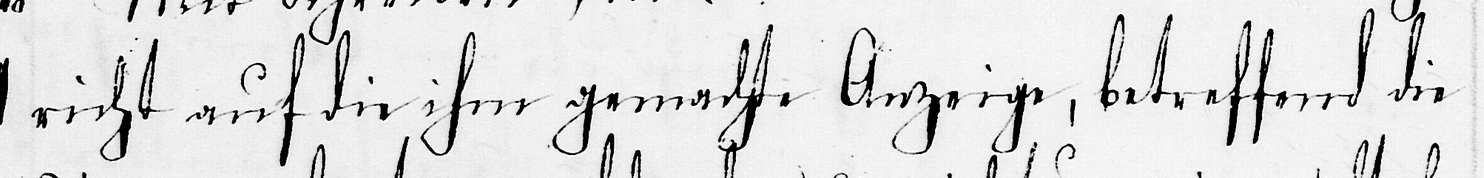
richt auf die ihm gemachte Anzeige, betreffend die
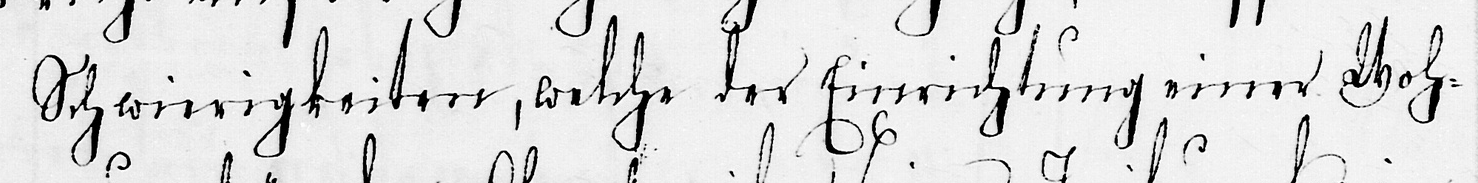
Schwierigkeiten, welche der Einrichtung einer Woh¬
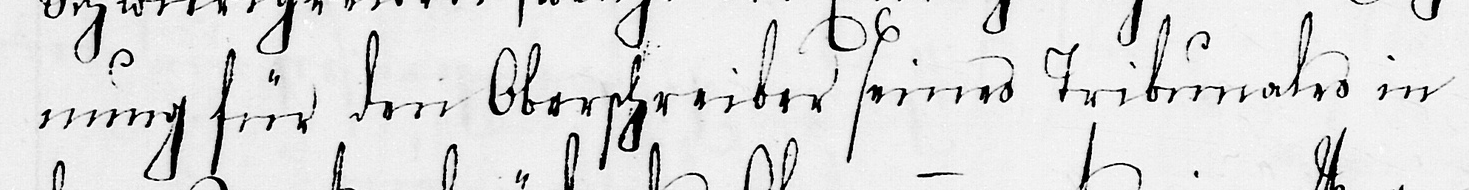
nung für den Oberschreiber seines Tribunales in
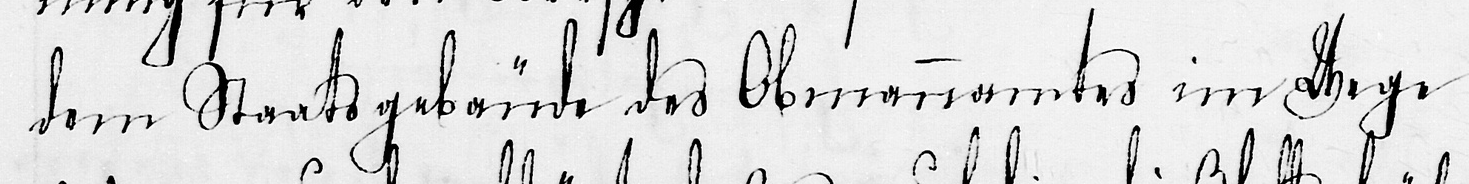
dem Staatsgebäude des Obmannamtes im Wege
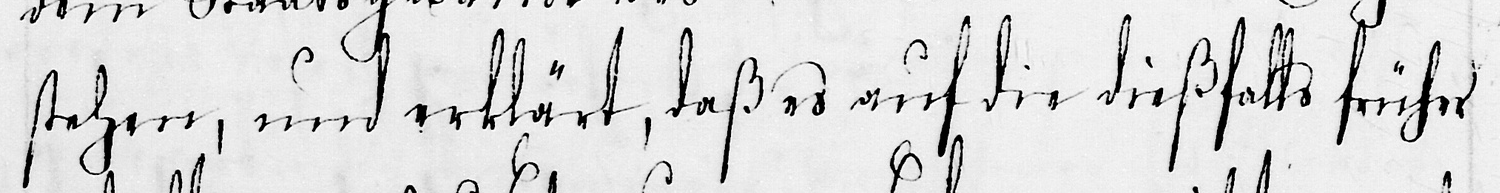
stehen, und erklärt, daß es auf die dießfalls früher
